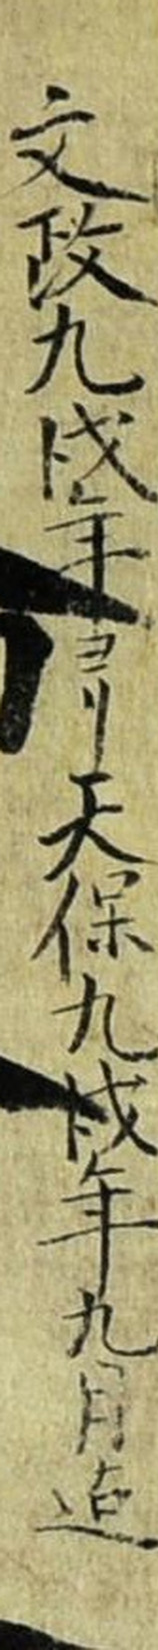文政九戌年ヨリ天保九戌年九月迄

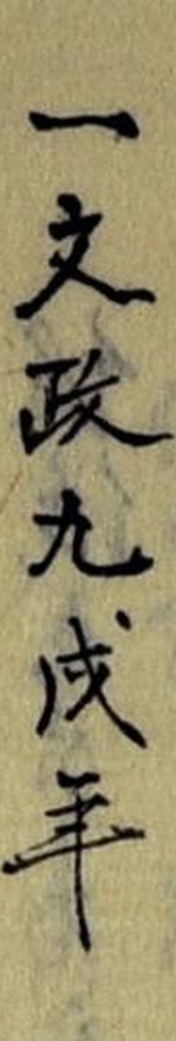一文政九戌年
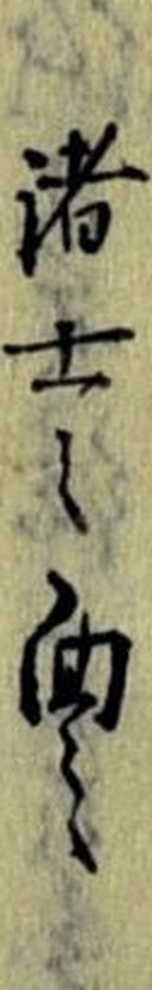諸士之面々
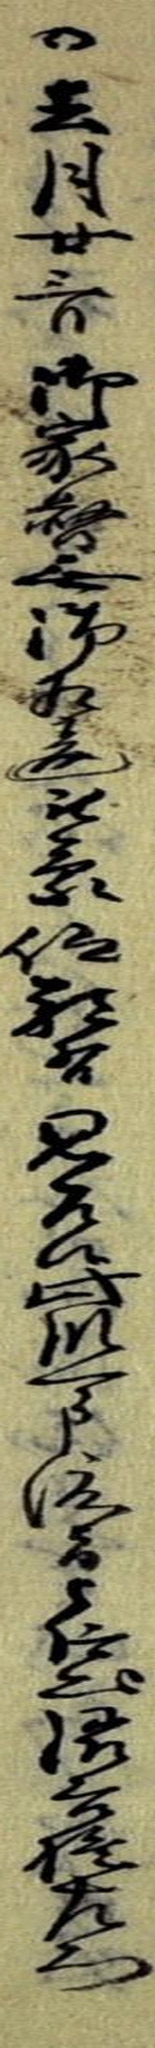○去月廿三日御家督無御相違被蒙仰難有思召候此段可申渡旨被仰出渋谷権左衛門
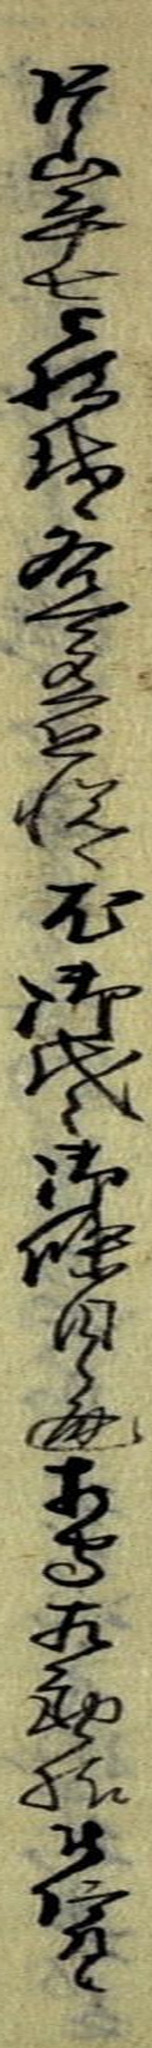片山平七被指越候各可有恐悦候尤御代々御条目之通相守相勤候様被仰付候
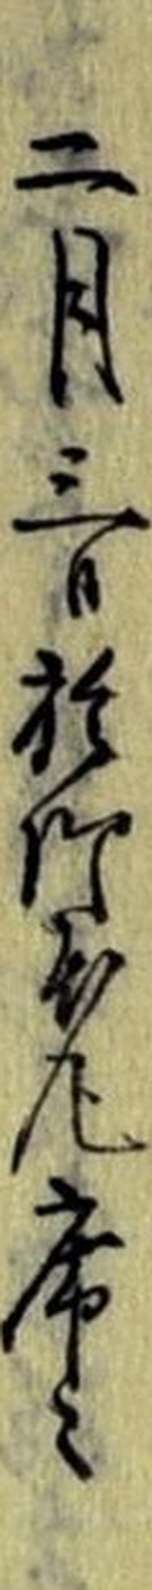二月三日於御本丸席々
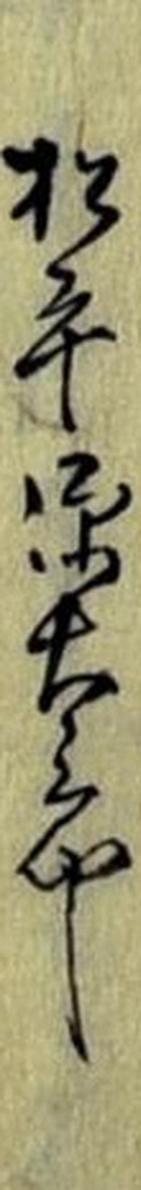松平源太郎
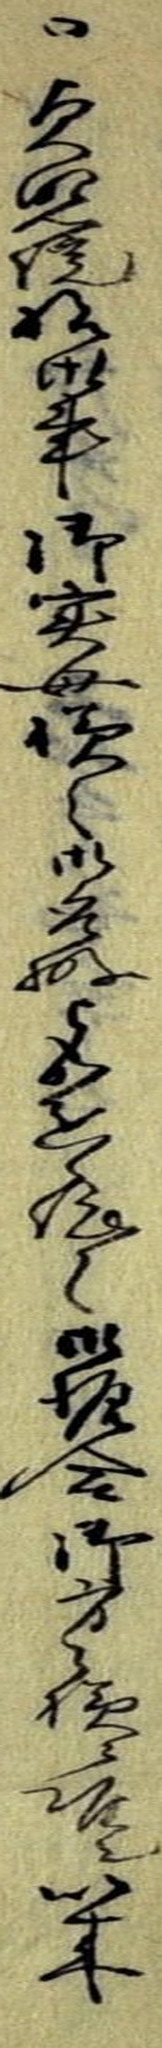○貞照院様御事御実母様之御取扱被成進候依之御振合御方々様ニ准シ以来
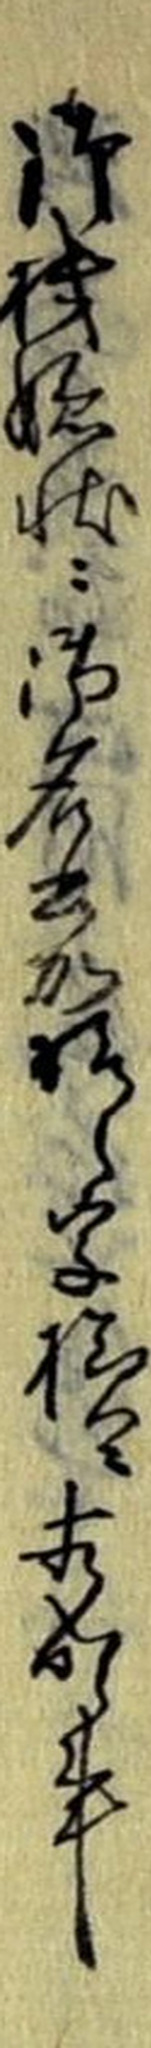御機嫌状ニ御名書加様之字様ニ相成候事
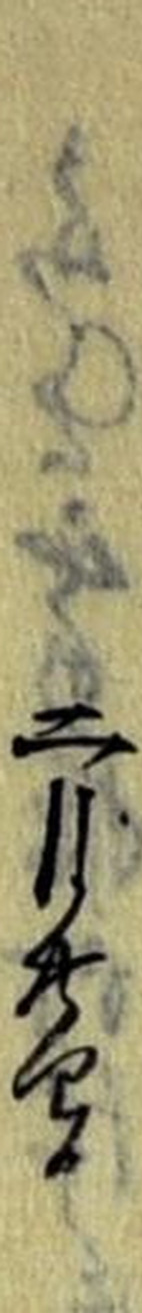二月廿四日
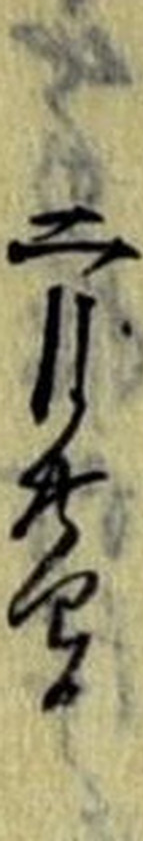二月廿四日
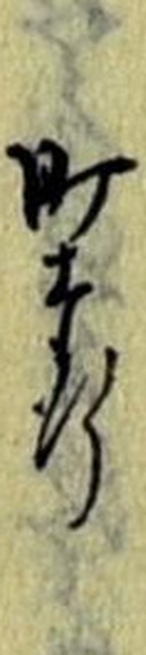町奉行
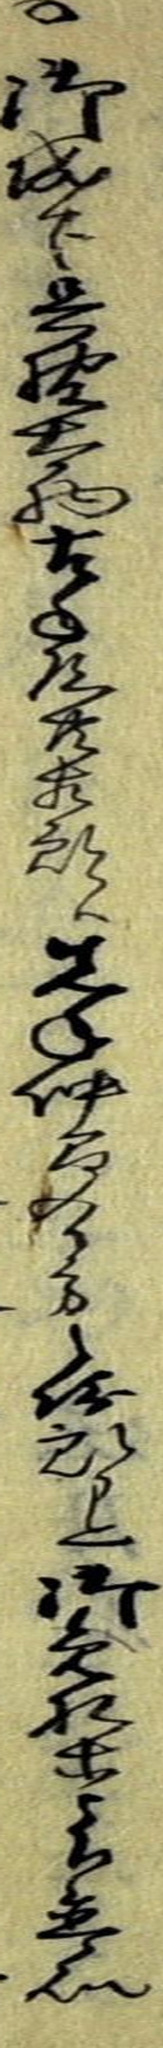○御城下呉服太物古手屋共相願候ハ先年仲間〆り方之儀願申上御免札等被下置候処
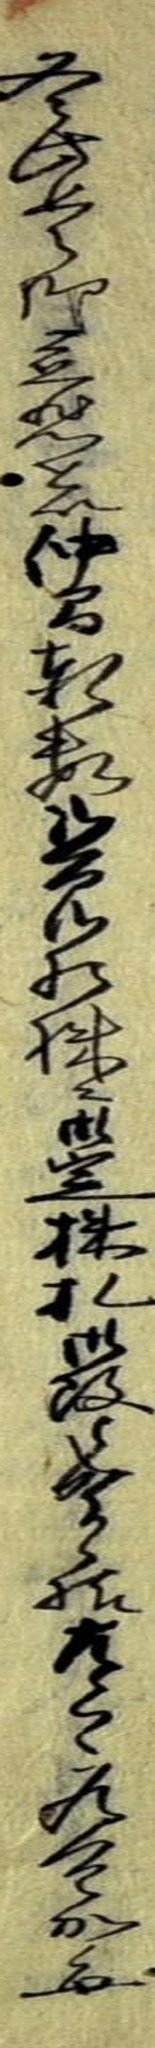又々此上之御慈悲を以仲間軒数弐百弐拾株ニ御定株札御改被成下候様左候ハヽ為冥加毎
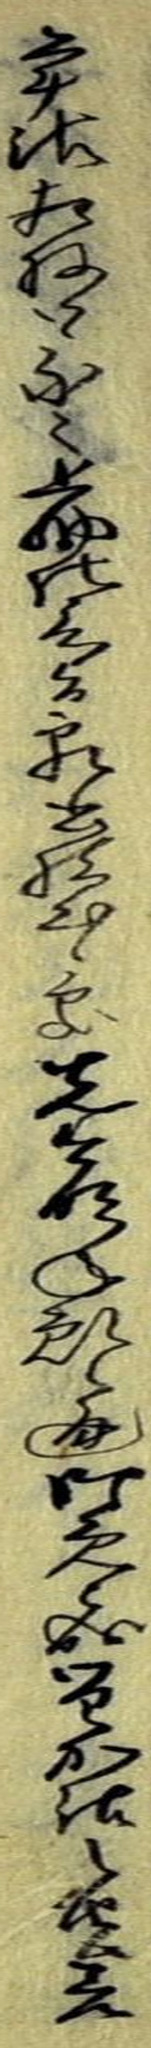年銀拾枚ツヽ永々上納仕度旨願出指出候処先今明年願之通御免被成冥加銀之儀ハ差

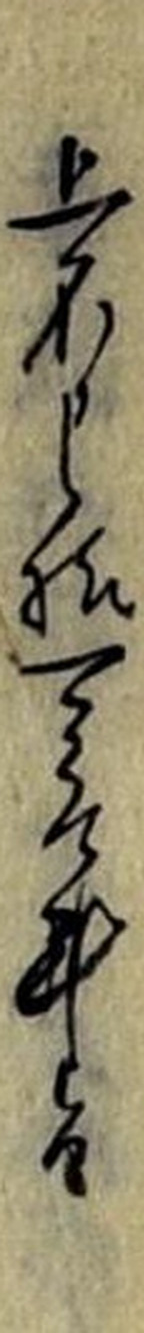上不申候様可被取斗旨
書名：命令之部 五
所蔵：福井県文書館 Fukui Prefectural Archives
